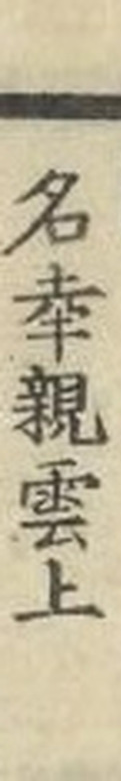名幸親雲上
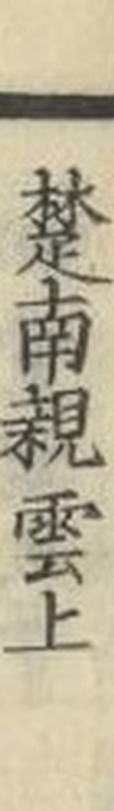楚南親雲上
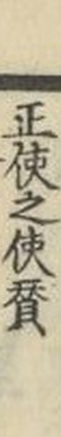正使之使賛
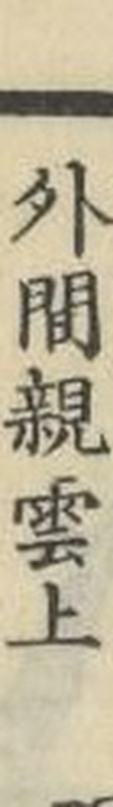外間親雲上
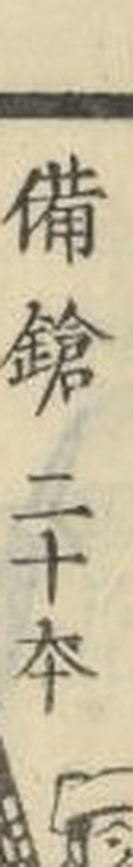備鎗二十本
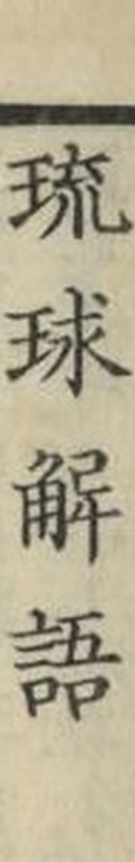琉球解語
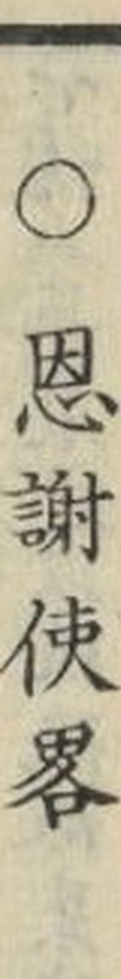○恩謝使略
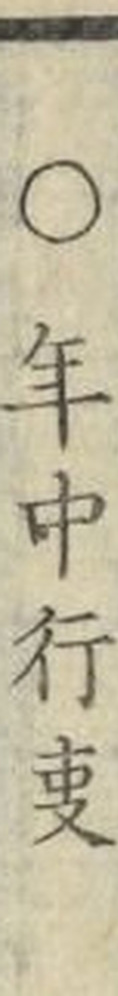○年中行事
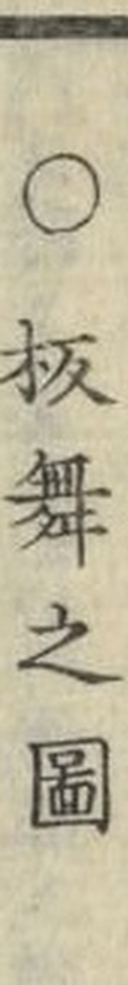○板舞之図
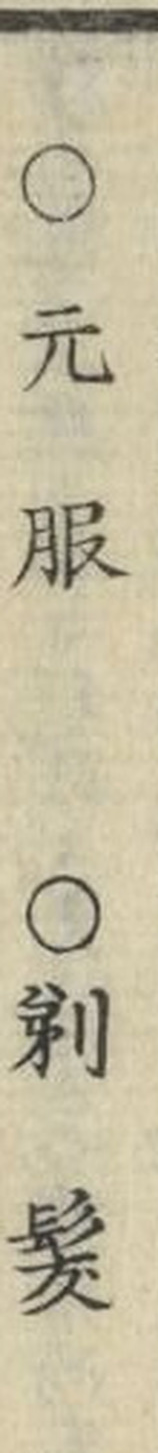○元服○剃髪
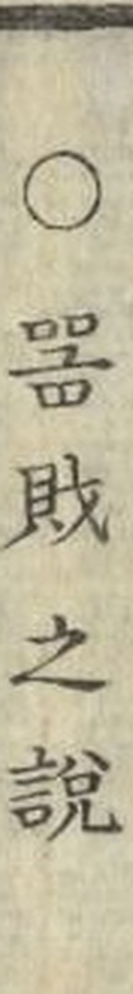○器財之説
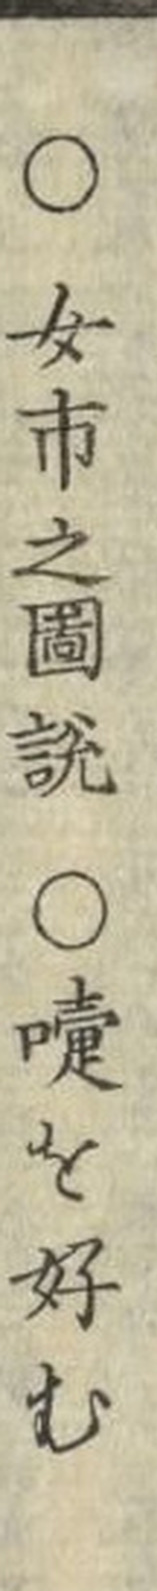○女市之図説○嚏を好む
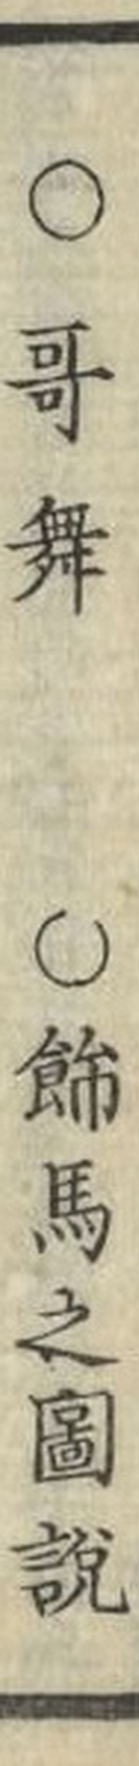○哥舞○飾馬之図説
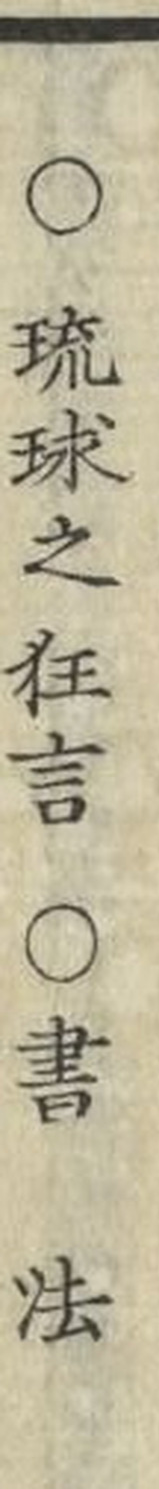○琉球之狂言○書法
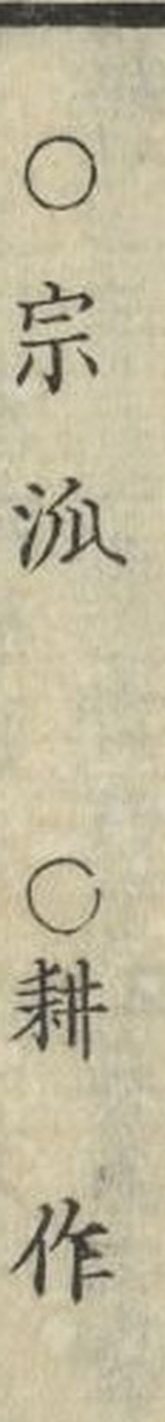○宗派○耕作

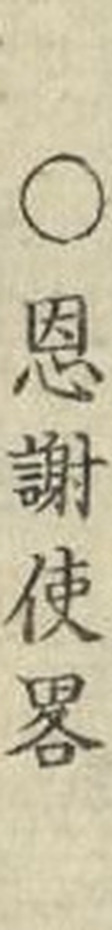○恩謝使略
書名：琉球解語
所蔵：University of the Ryukyus Library
